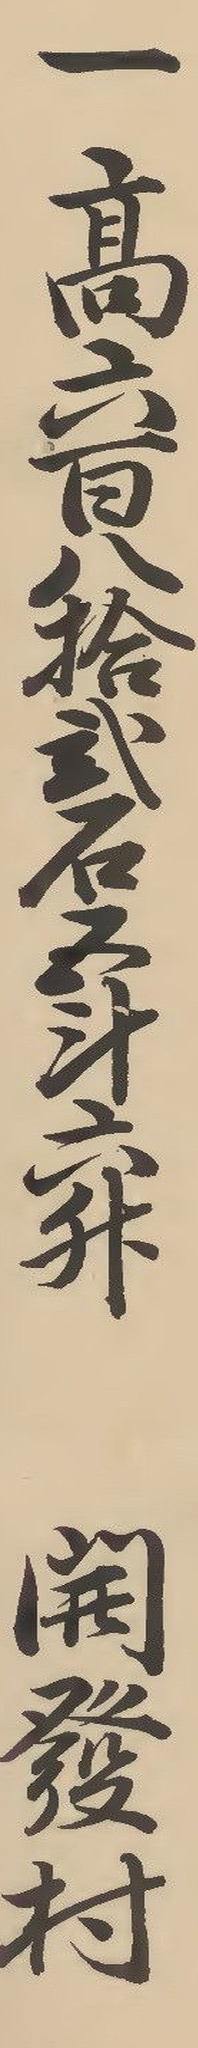一高六百八拾弐石五斗六升開発村
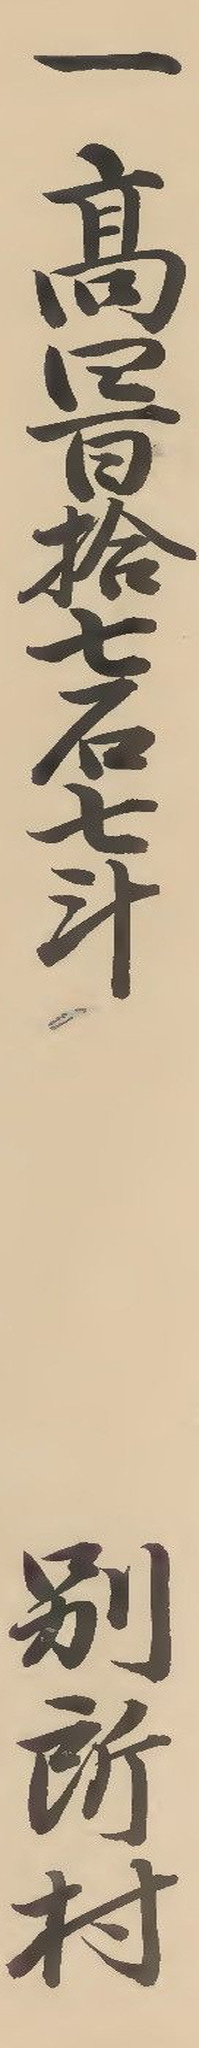一高四百拾七石七斗別所村
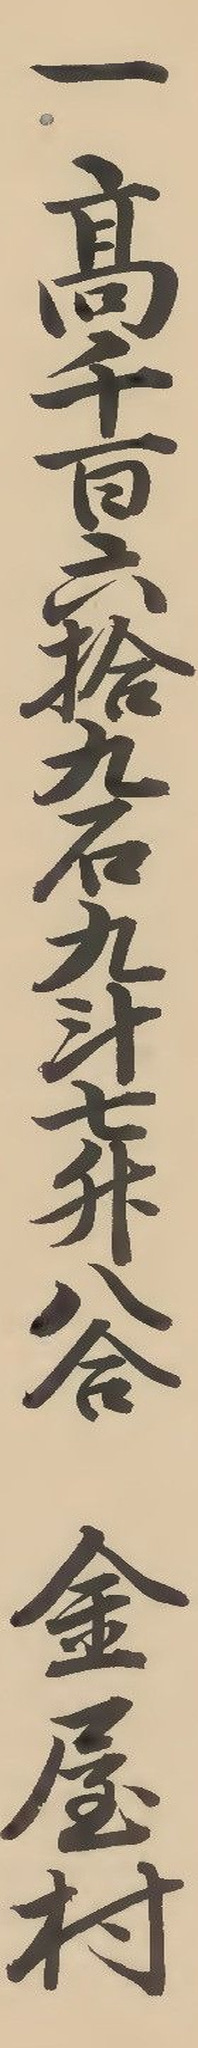一高千百六拾九石九斗七升八合金屋村
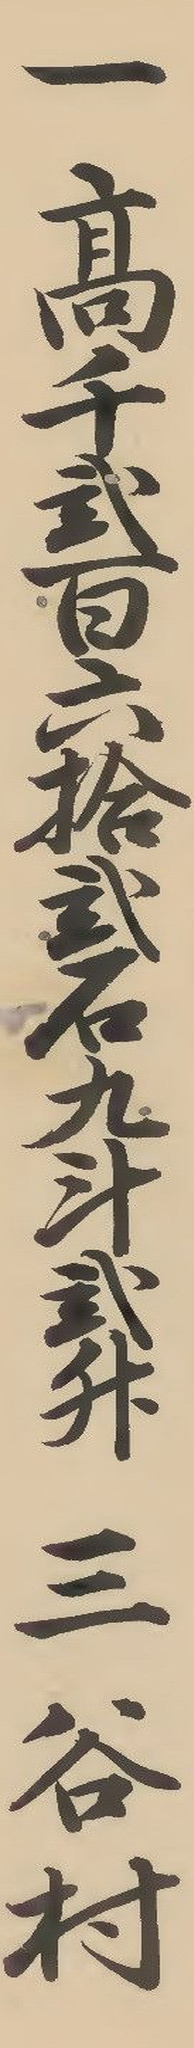一高千弐百六拾弐石九斗弐升三谷村

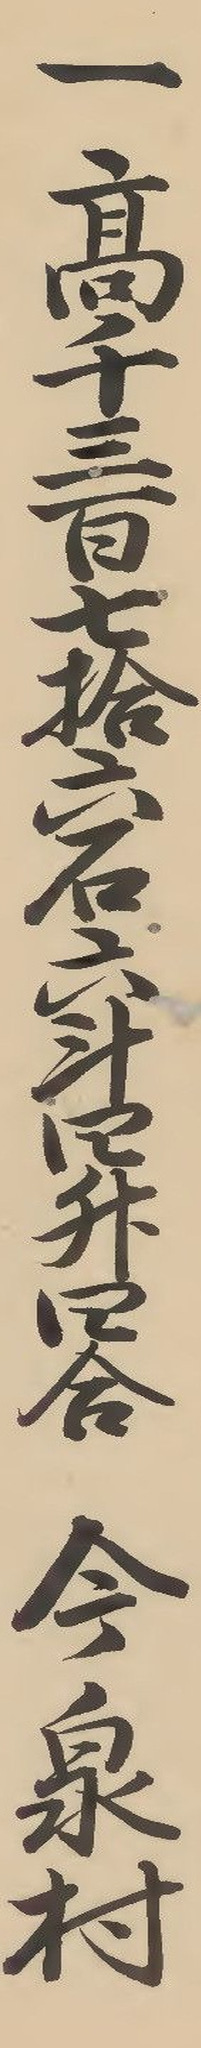一高千三百七拾六石六斗四升四合今泉村
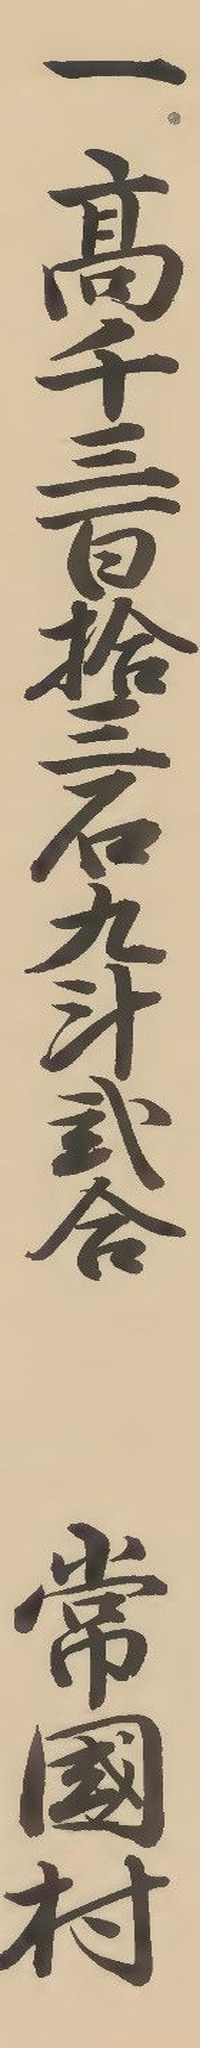一高千三百拾三石九斗弐合常国村
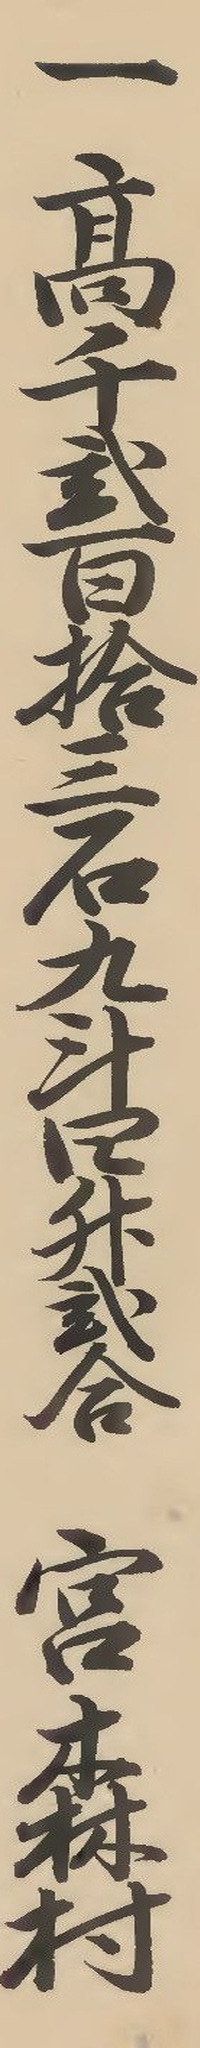一高千弐百拾三石九斗四升弐合宮森村
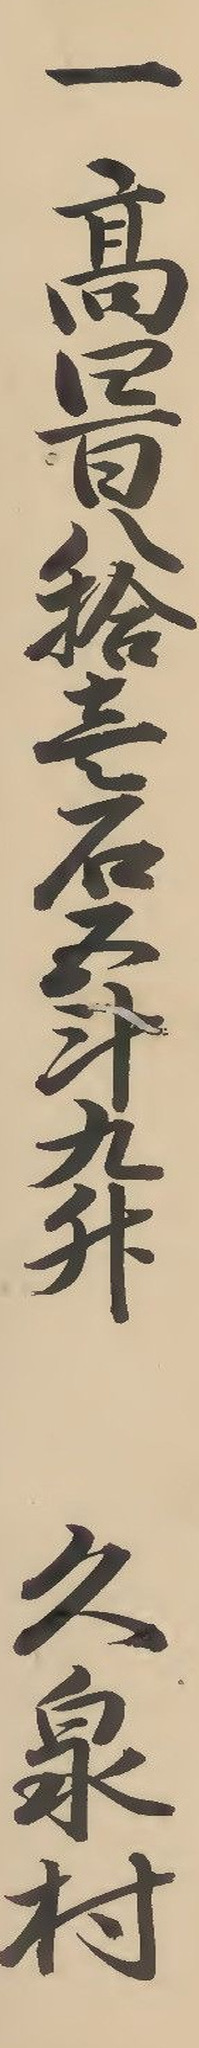一高四百八拾壱石五斗九升久泉村
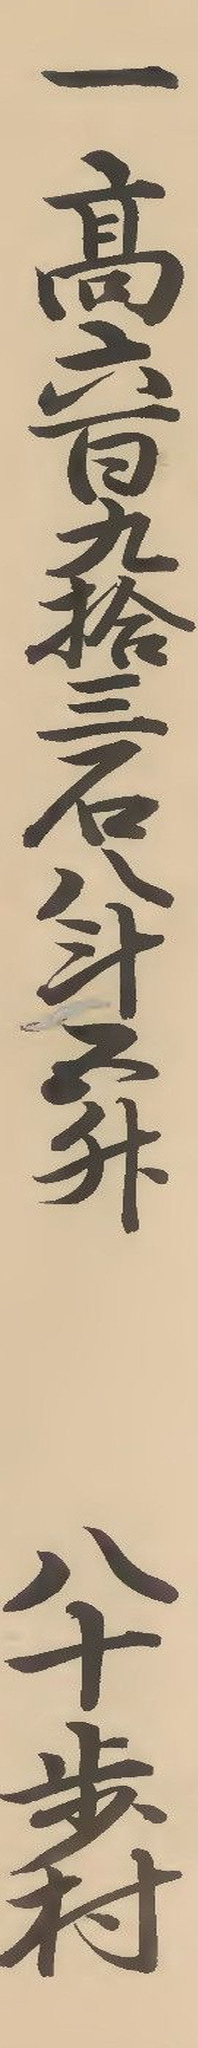一高六百九拾三石八斗五升八十歩村
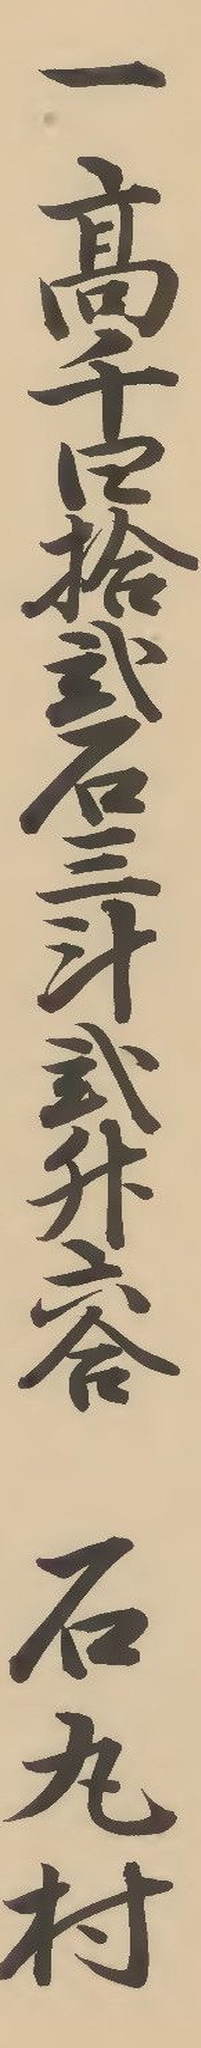一高千四拾弐石三斗弐升六合石丸村
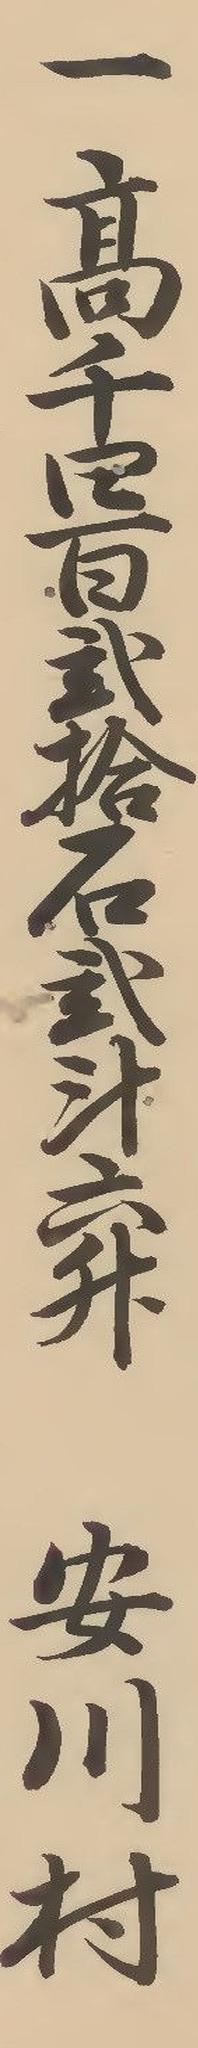一高千四百弐拾石弐斗六升安川村

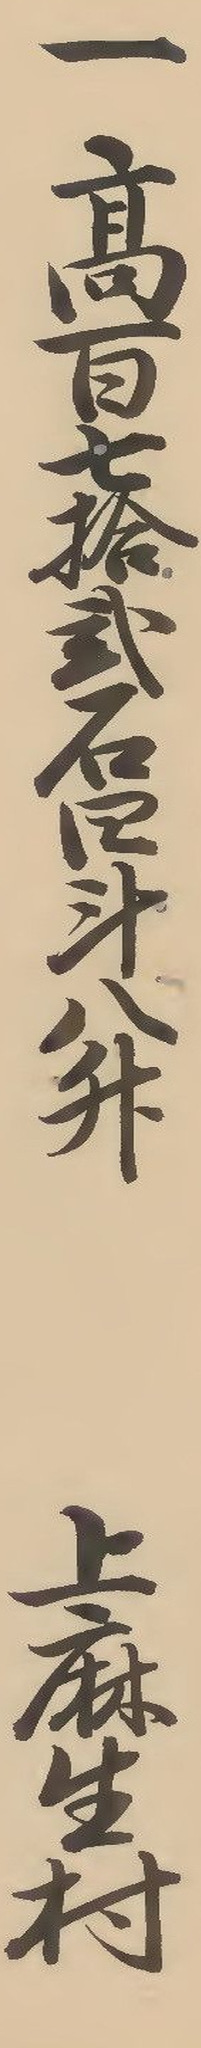一高百七拾弐石四斗八升上麻生村
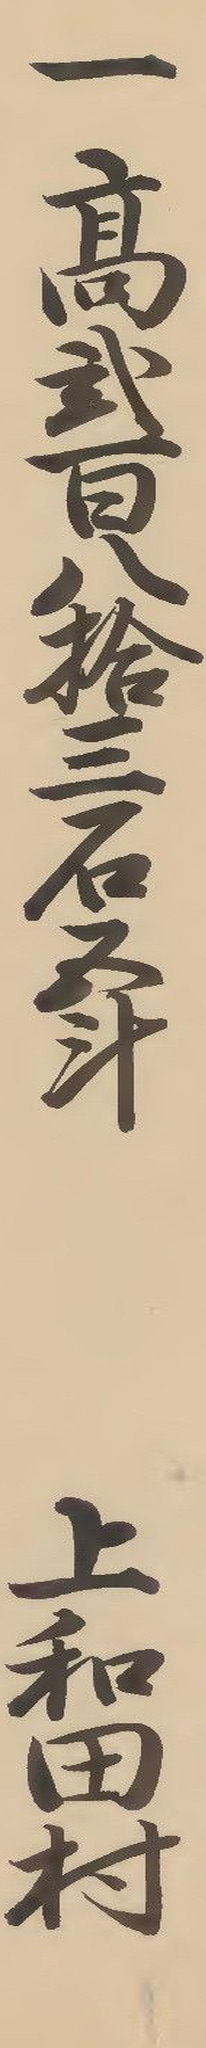一高弐百八拾三石五斗上和田村
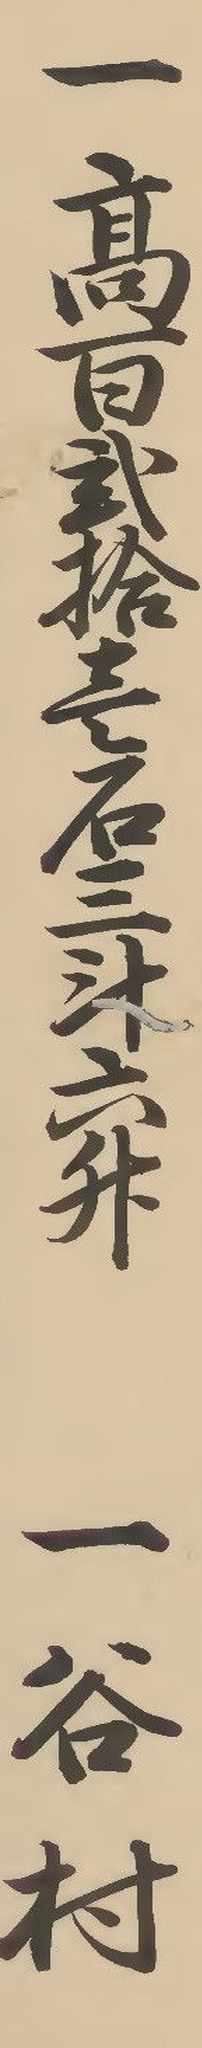一高百弐拾壱石三斗六升一谷村
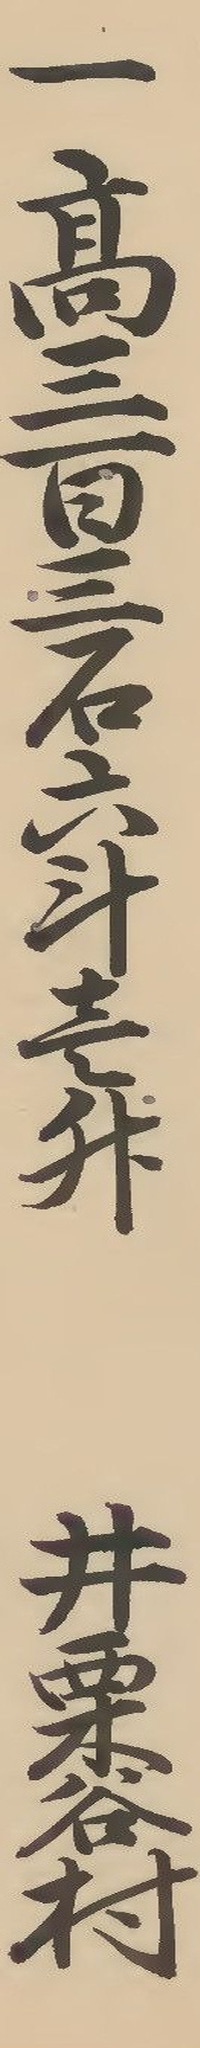一高三百三石六斗壱升井栗谷村

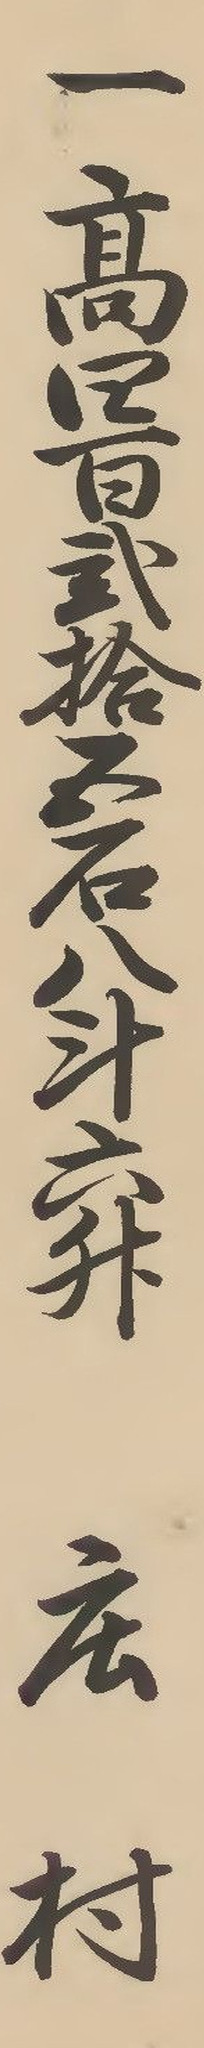一高四百弐拾五石八斗六升庄村
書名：越中国郷帳
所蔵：国立公文書館 National Archives of Japan
